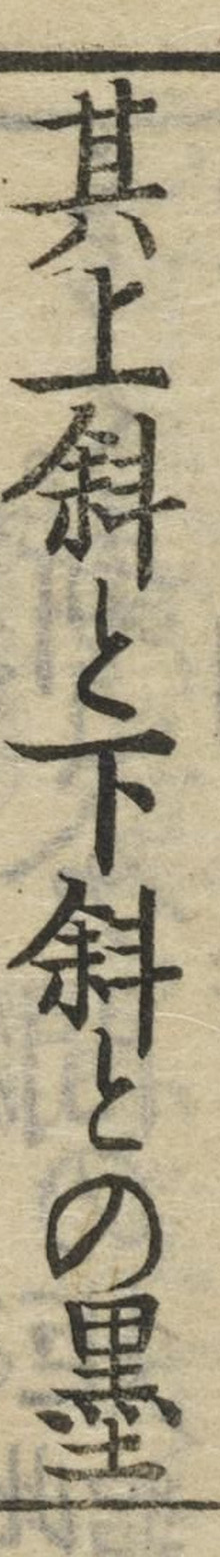其上斜と下斜との墨
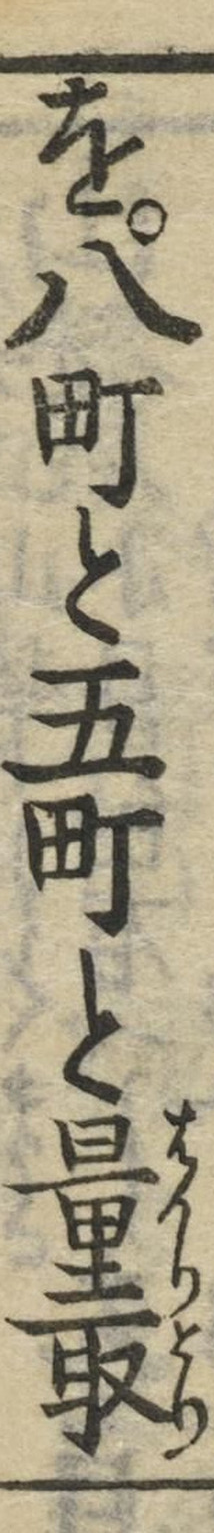を。八町と五町と量取
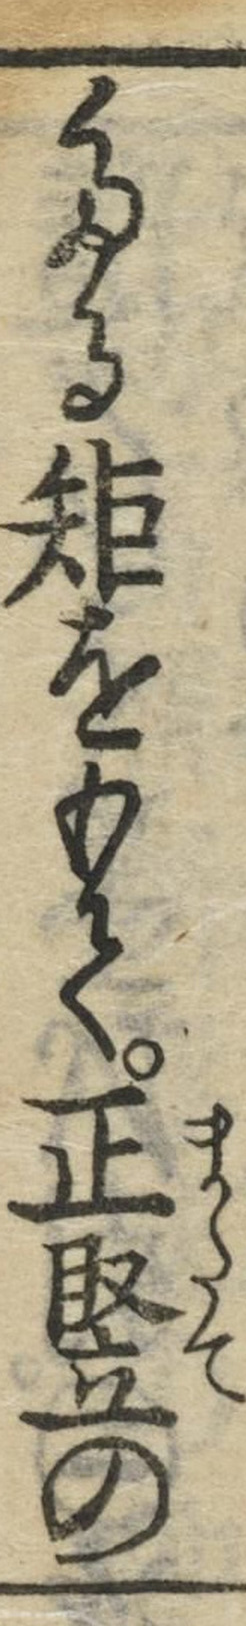たる矩をもて。正竪の
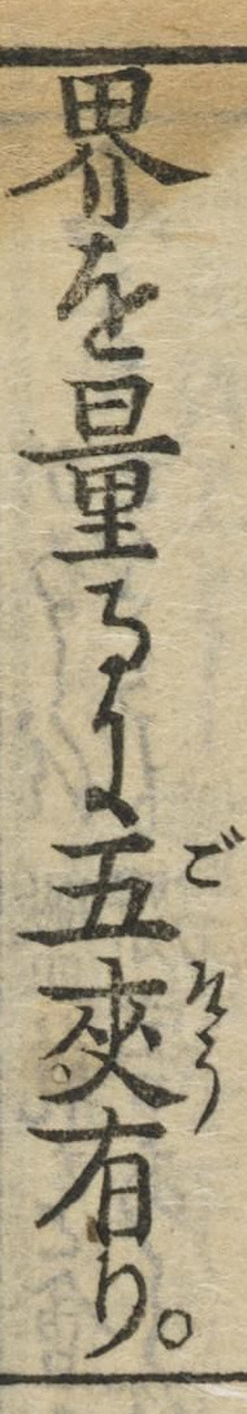界を量るに五夾有り。
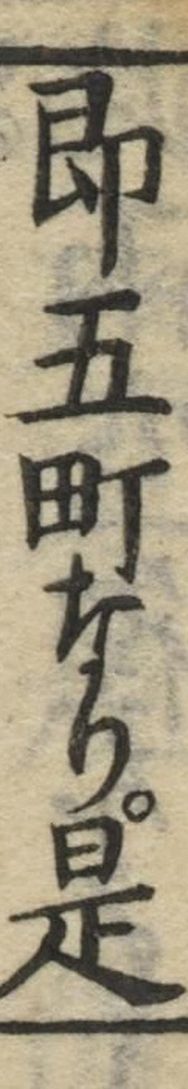即五町なり。是
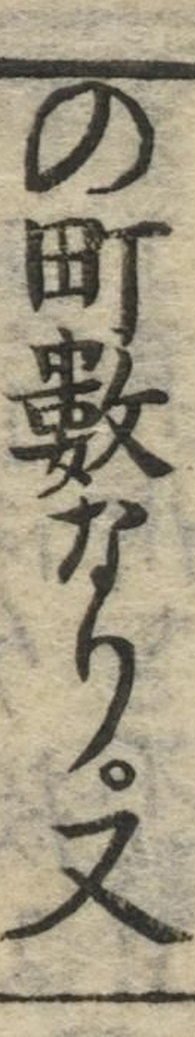の町数なり。又
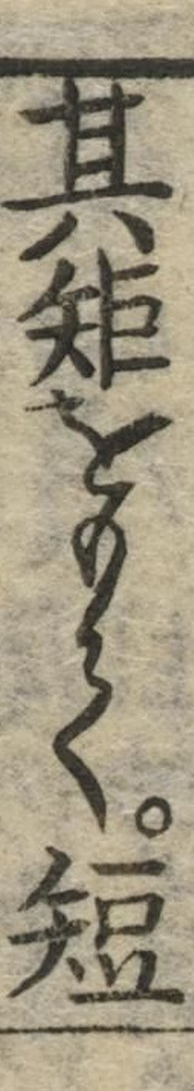其矩をもて。短
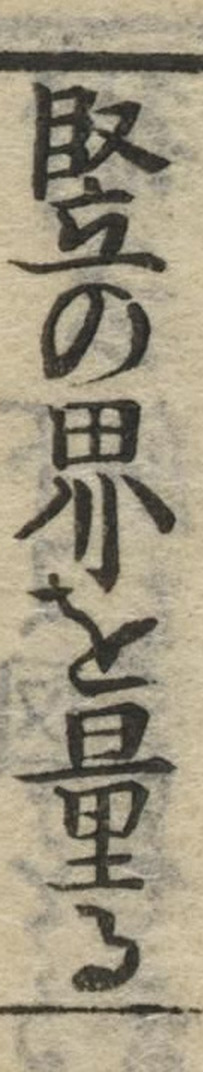竪の界を量る
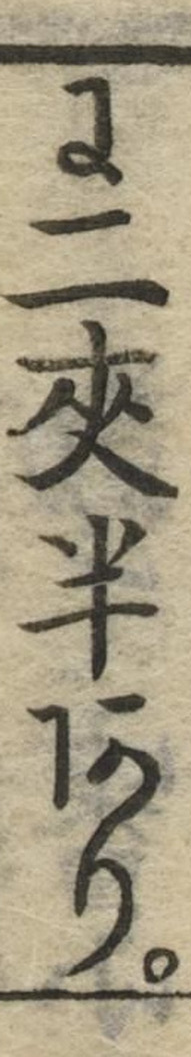に二夾半あり。
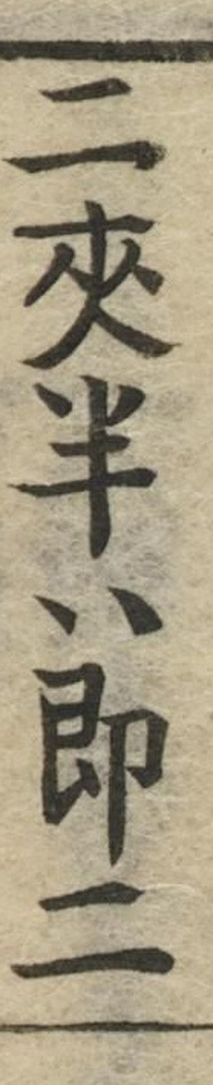二夾半は即二
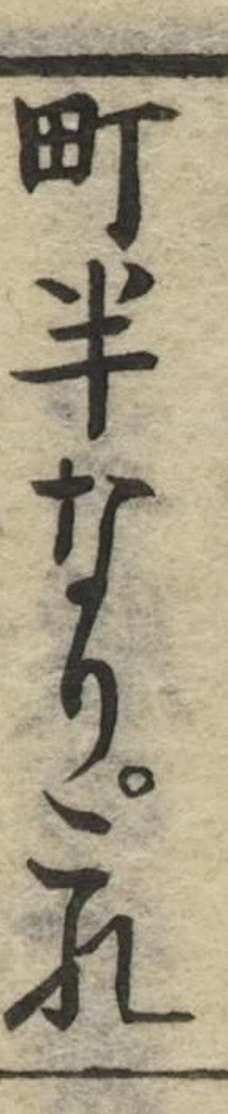町半なり。これ

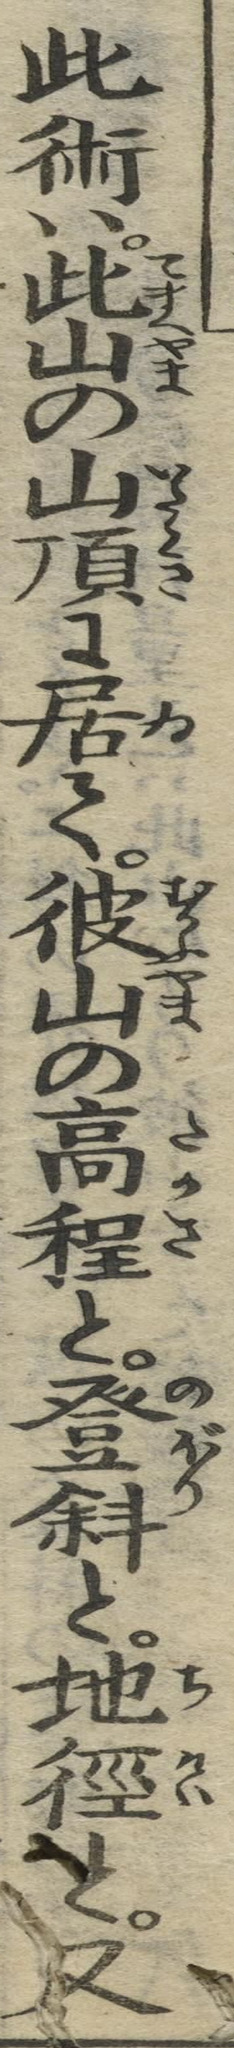此術は。此山の山頂に居て。彼山の高程と。登斜と。地径と。又
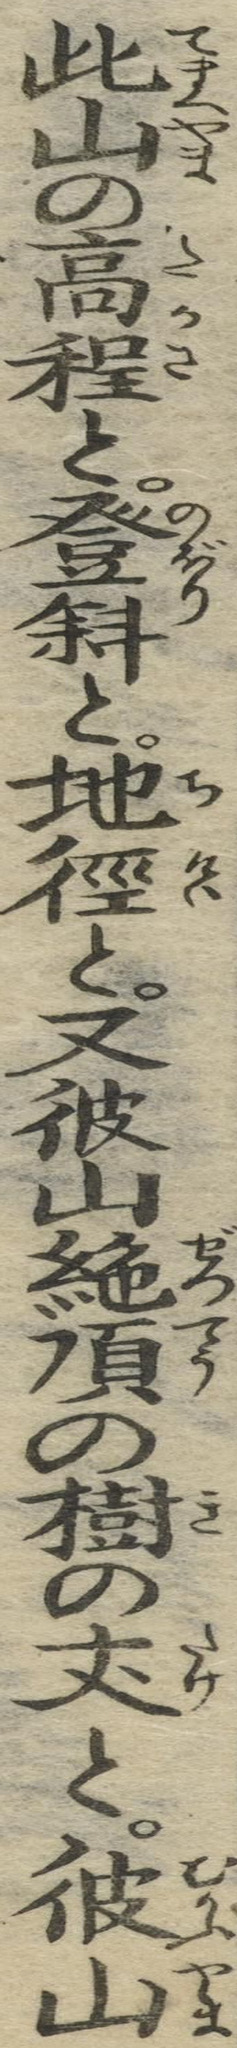此山の高程と。登斜と。地径と。又彼山絶頂の樹の丈と。彼山
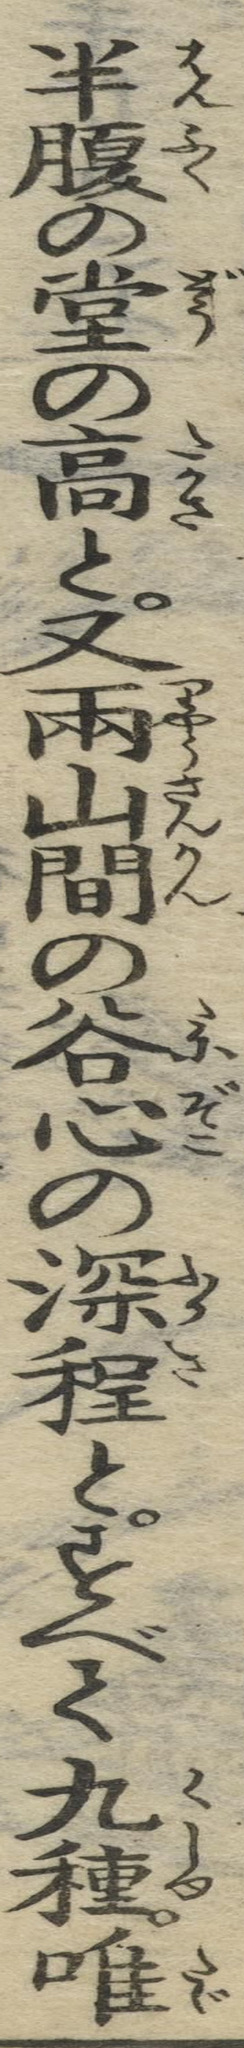半腹の堂の高と。又両山間の谷心の深程と。すべて九種。唯
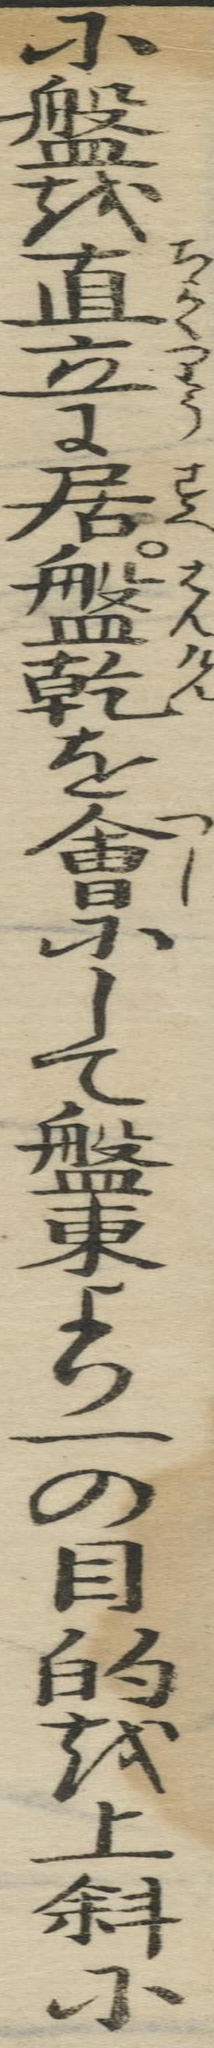に盤を直立に居。盤乾を会にして盤東より一の目的を上斜に
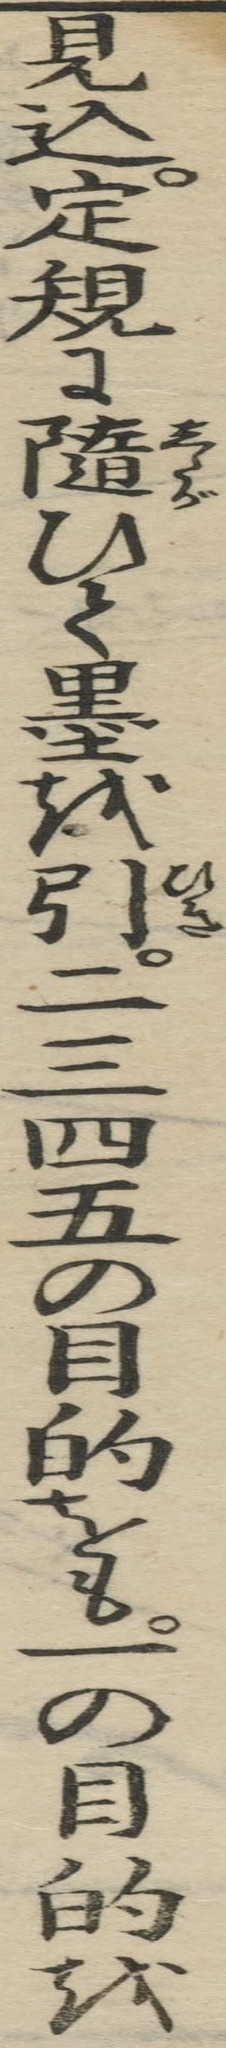見込。定規に随ひて墨を引。二三四五の目的をも。一の目的を
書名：量地指南　巻之三（内題）
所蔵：東京大学地震研究所図書室 Earthquake Research Institute Library, The University of Tokyo, JAPAN
